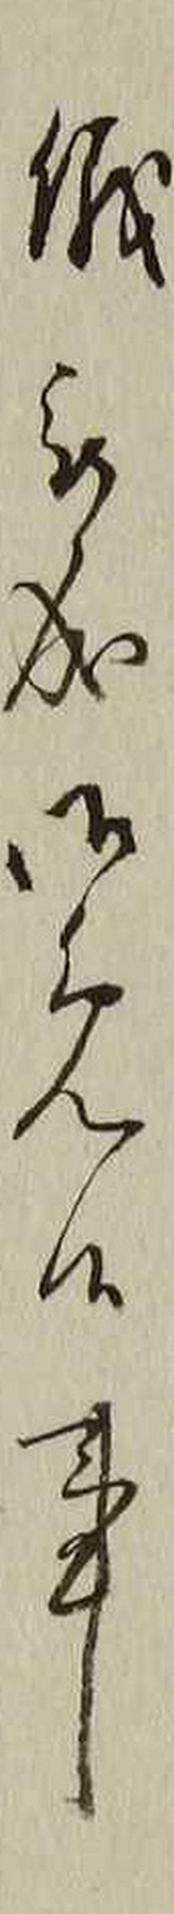儀被成御免候事
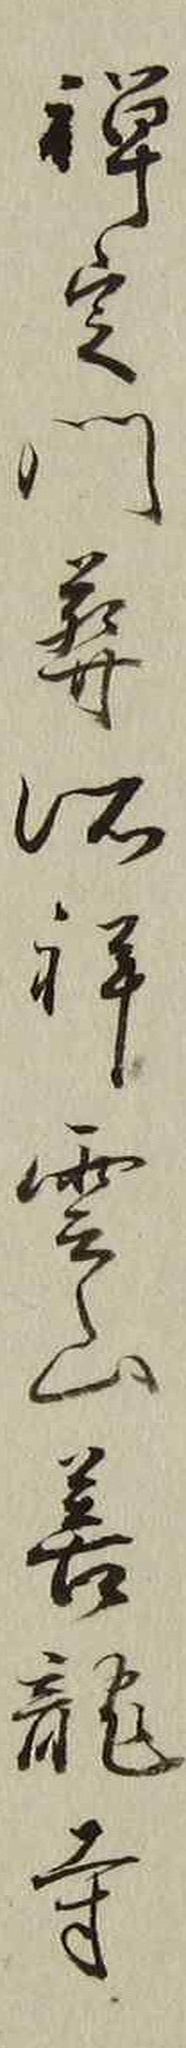禅定門葬所祥雲山善龍寺
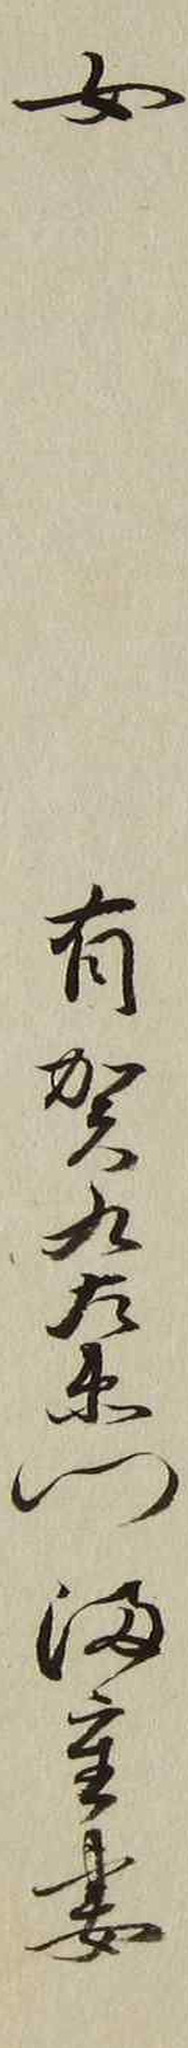女有賀九左衛門満重妻
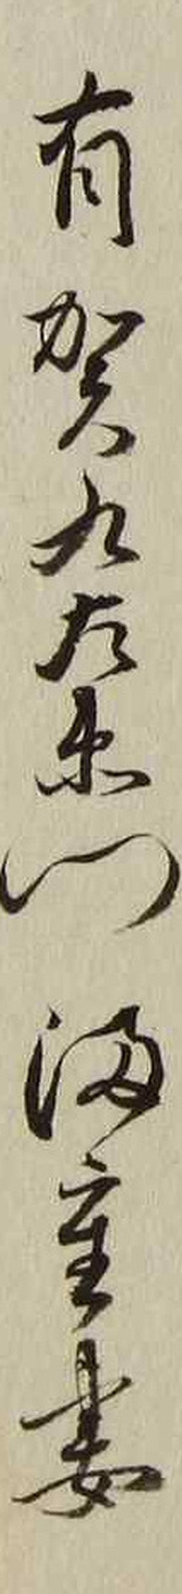女有賀九左衛門満重妻
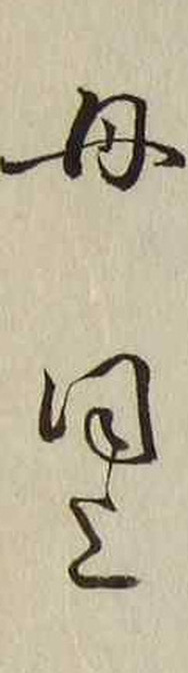母同上

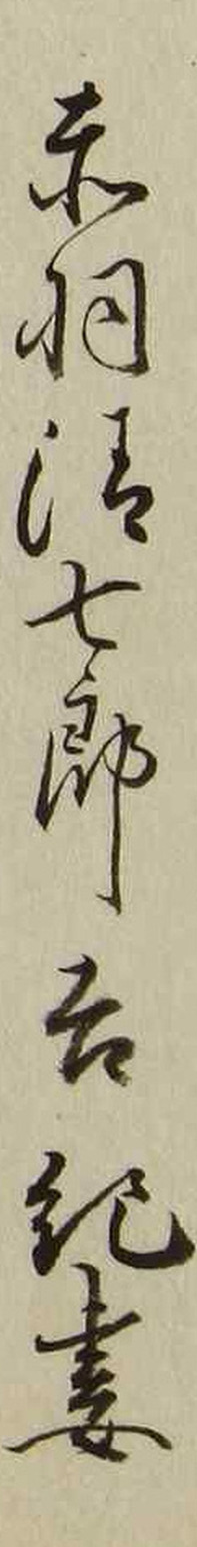女赤羽清七郎吉紀妻
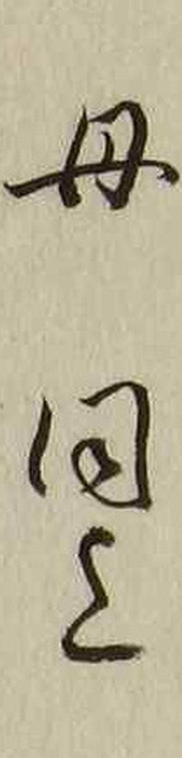母同上
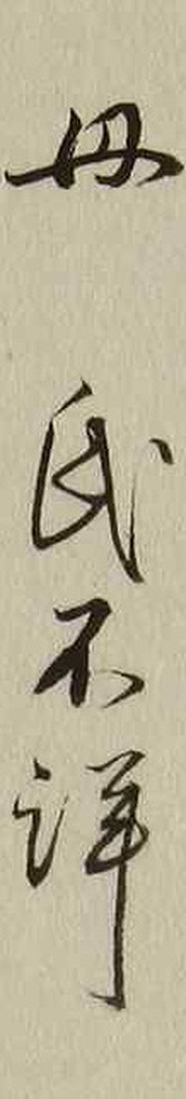母氏不詳
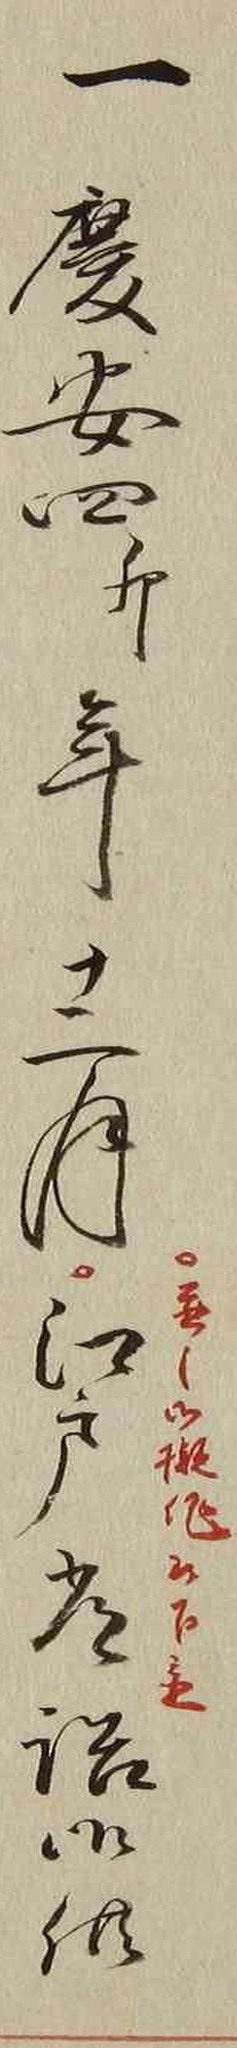一慶安四卯年十二月◦江戸常詰御供
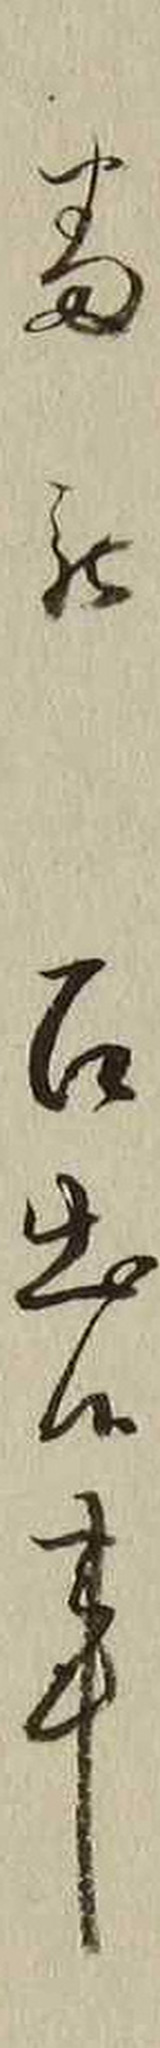番被召出候事
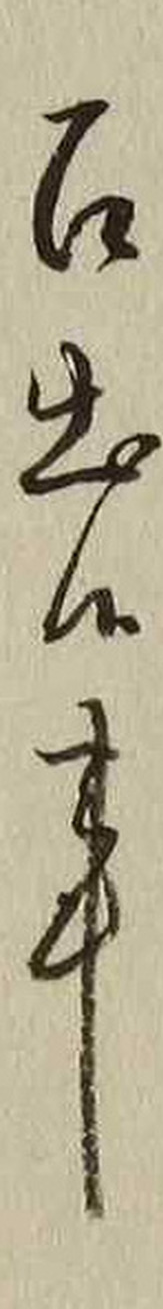召上候事
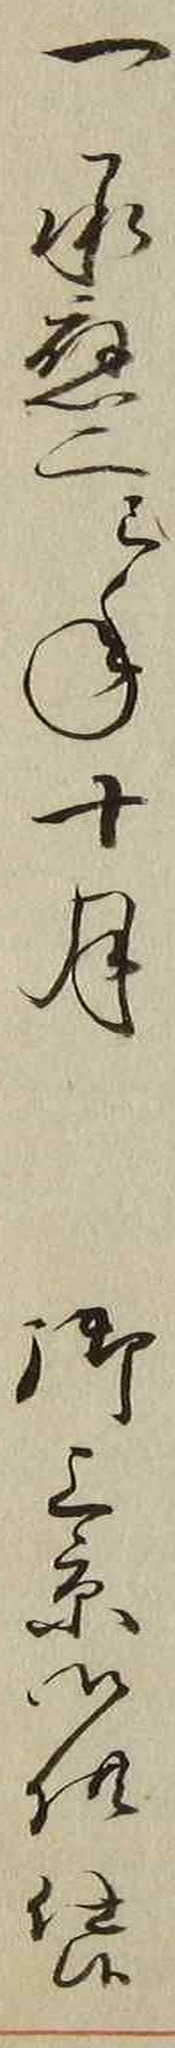一承応二巳年十月御上京御供仕候
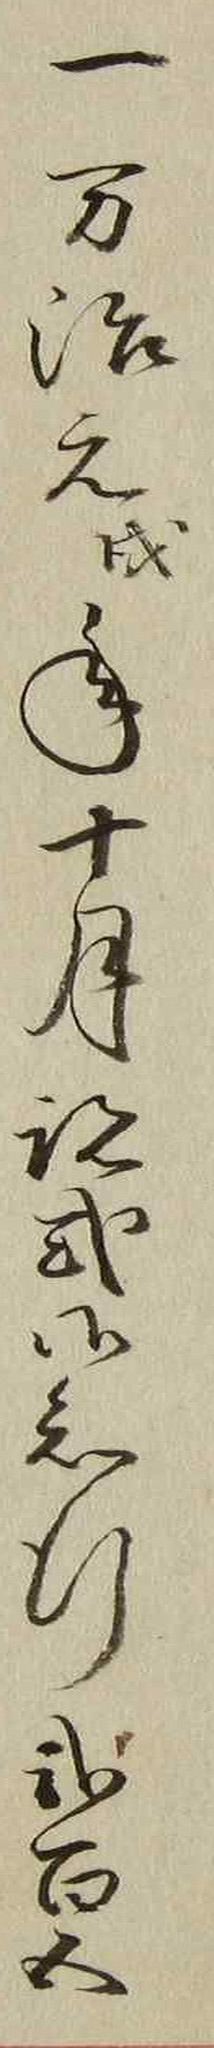一万治元戌年十月跡式御知行弐百五
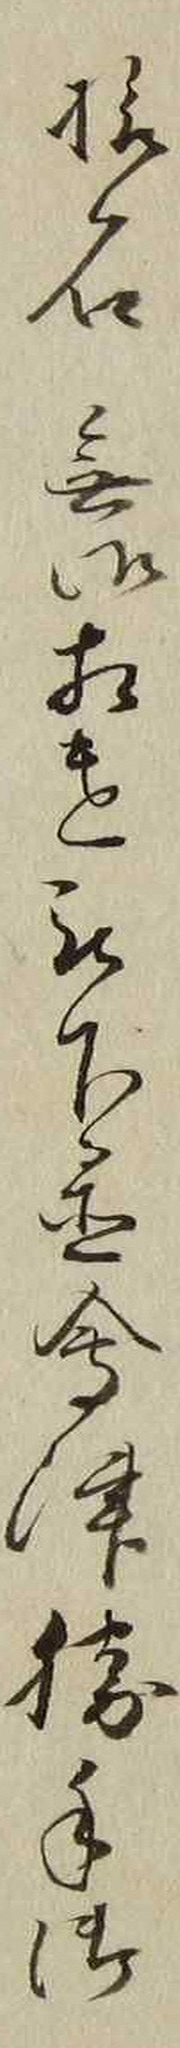拾石無御相違被下置会津勝手御
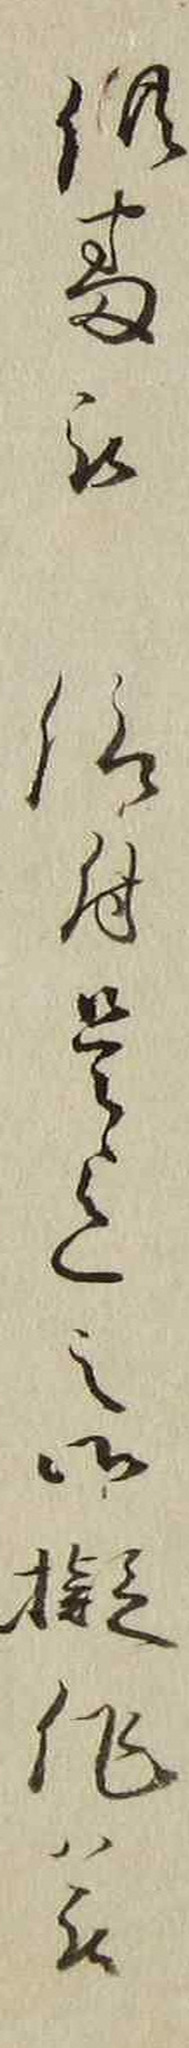供番被仰付是迄之御擬作ハ被
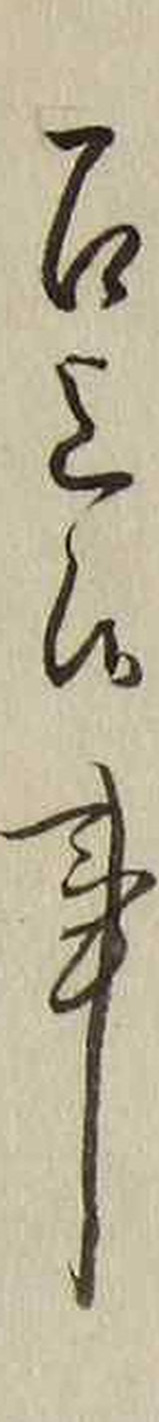召上候事
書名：諸士系譜　巻之2　い之部2
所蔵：会津若松市立会津図書館
